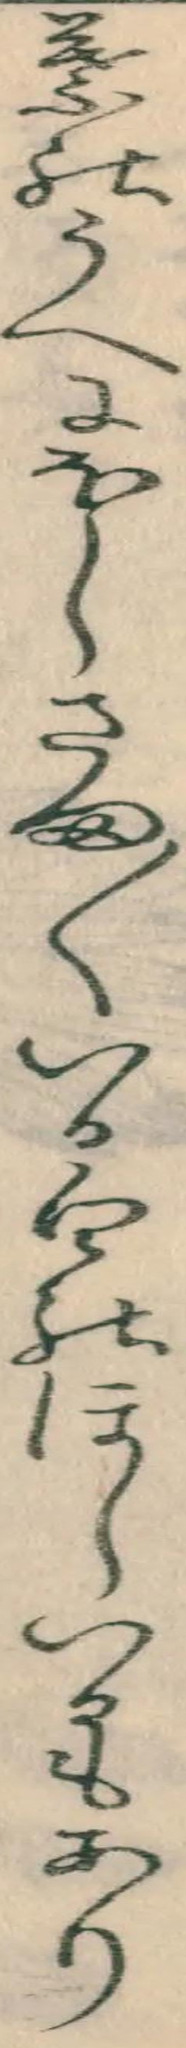葉のうへにほしさま〳〵いる白のほしいるもあり
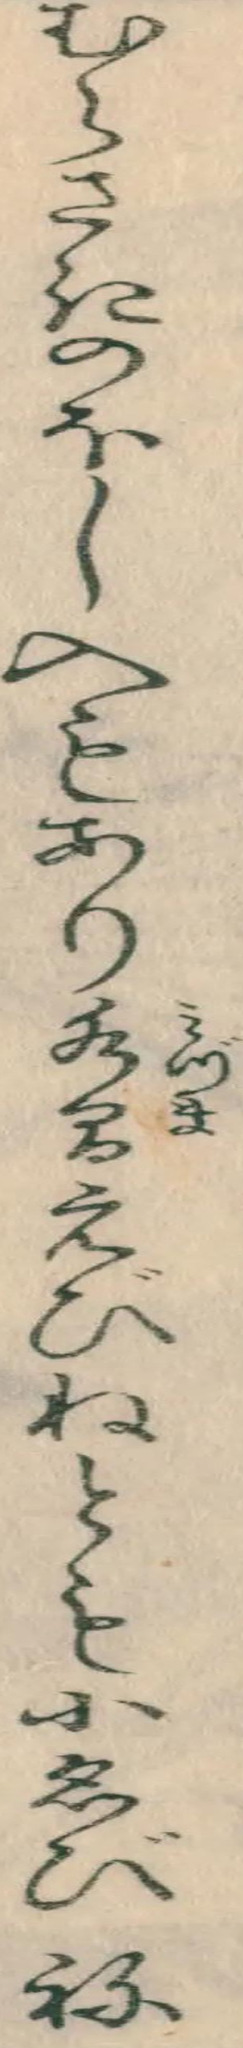むらさきのほし入もあり水間えびねとも小ゑびね
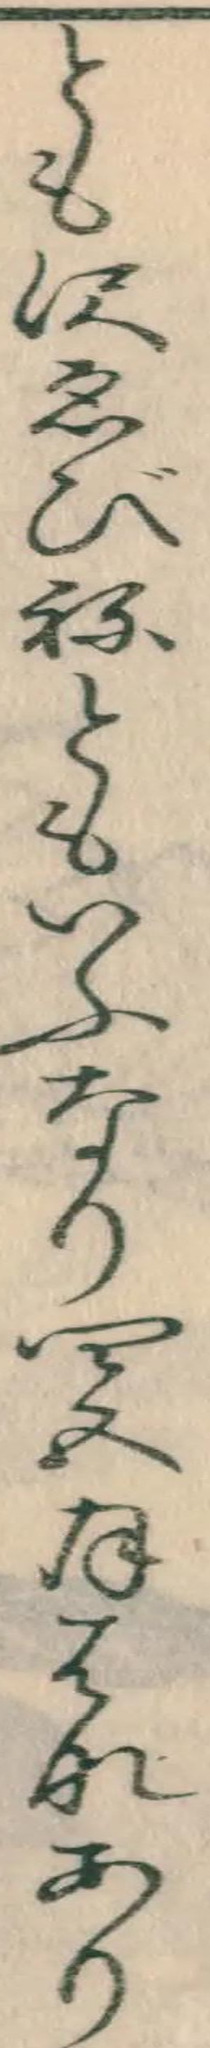とも沢ゑびねともいふなり四五月はなあり
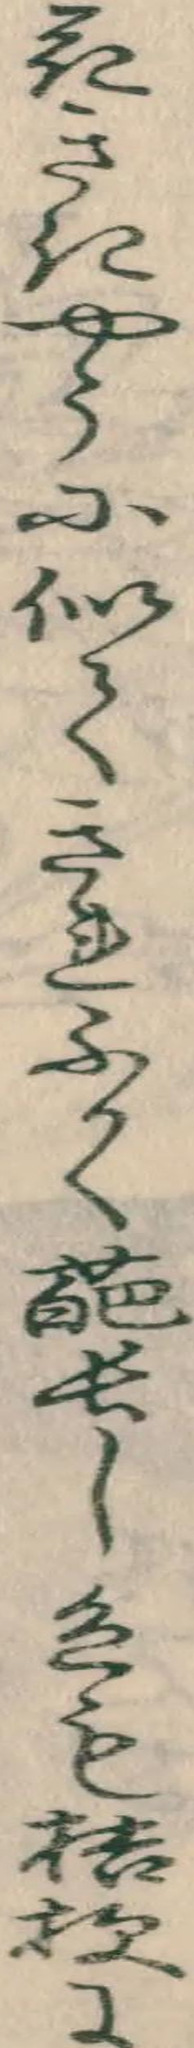花ききやうに似てきれふかく葩長し色も桔梗に
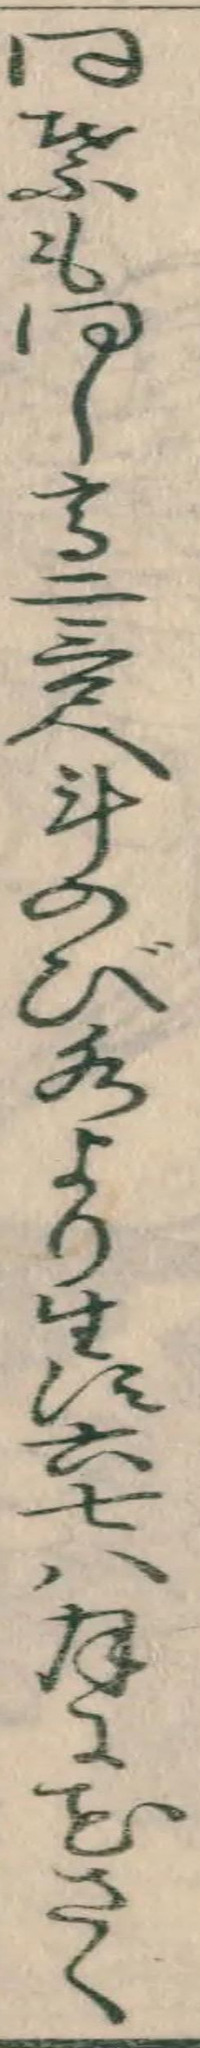同葉も同し高二三尺斗のび水より生す六七八月に花さく
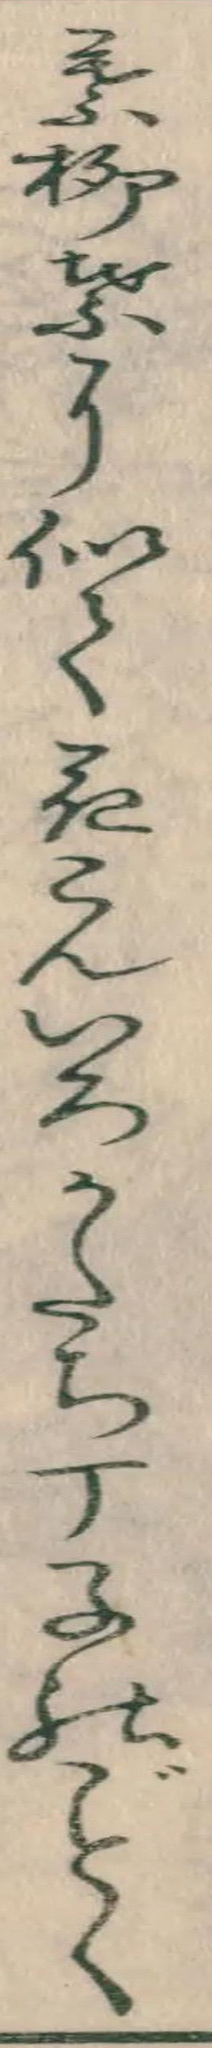葉柳葉に似て花こんいろかたち丁子のごとく
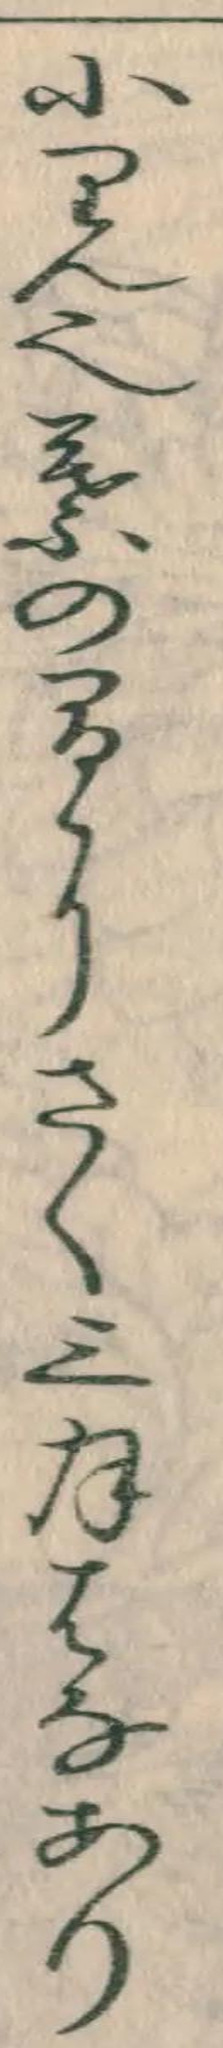小りん也葉の間にさく三月はなあり
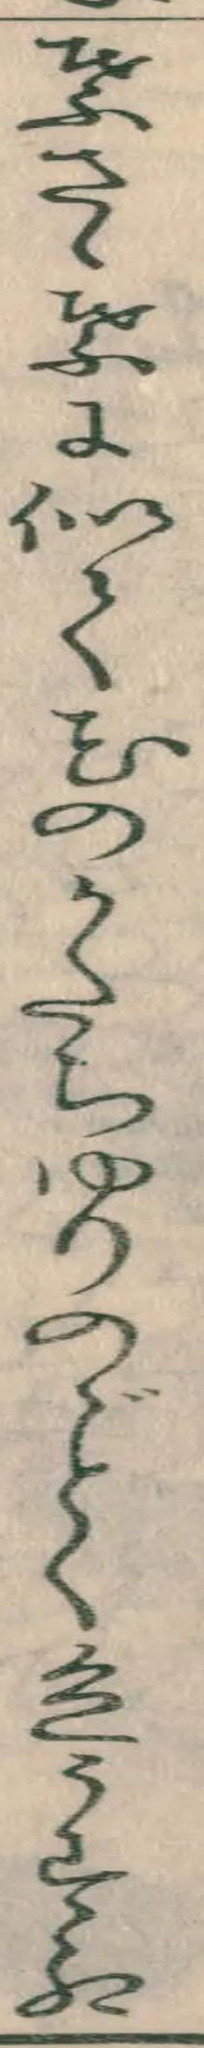葉さゝ葉に似て花のかたちゆりのごとく色うす紅
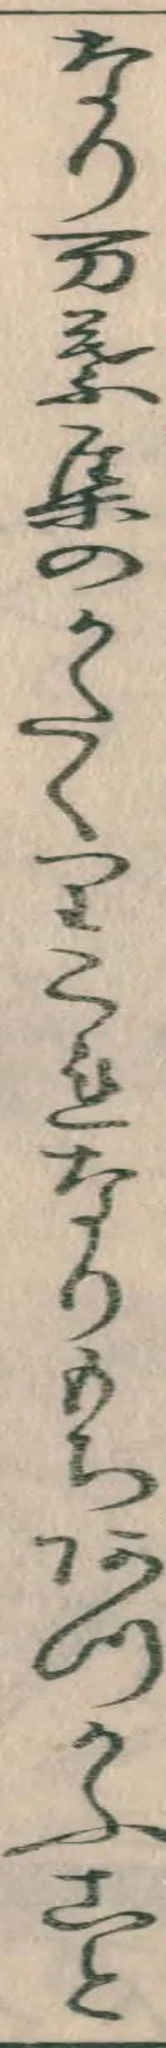なり万葉集のかたくりこれなりもちあつかふこと
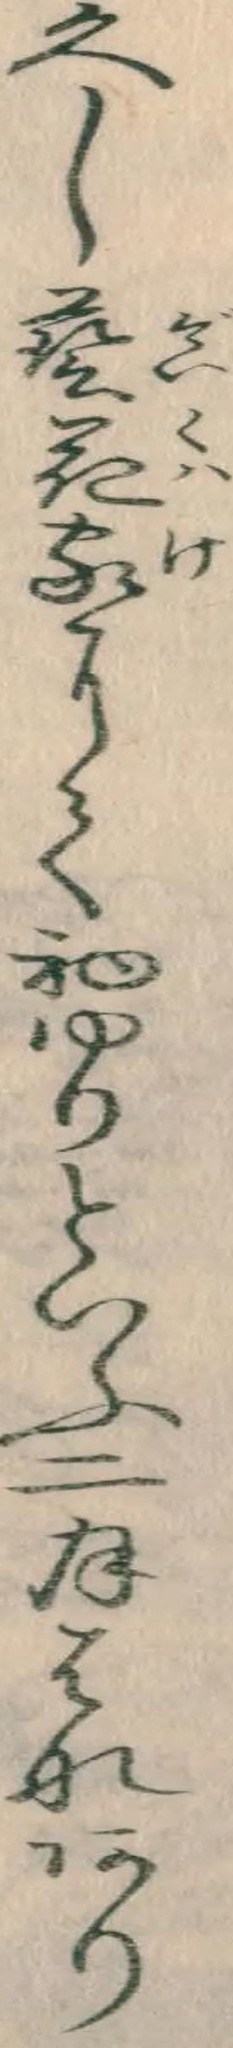久し芸花家にて初ゆりといふ二月はなあり
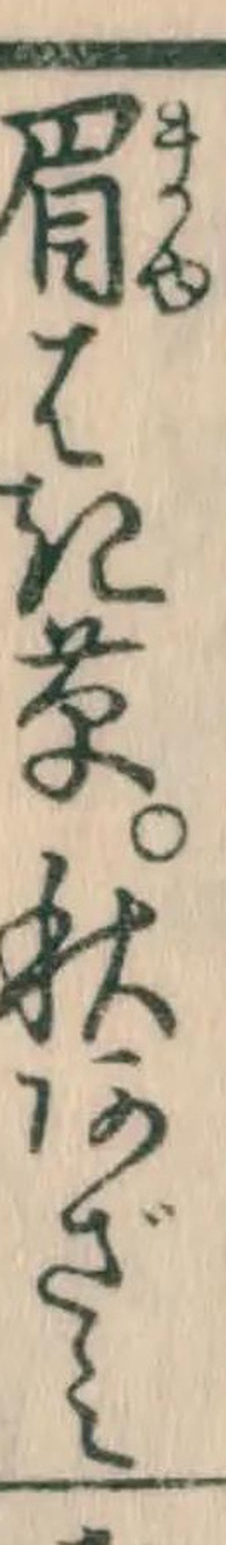[眉はき草。秋あざみ
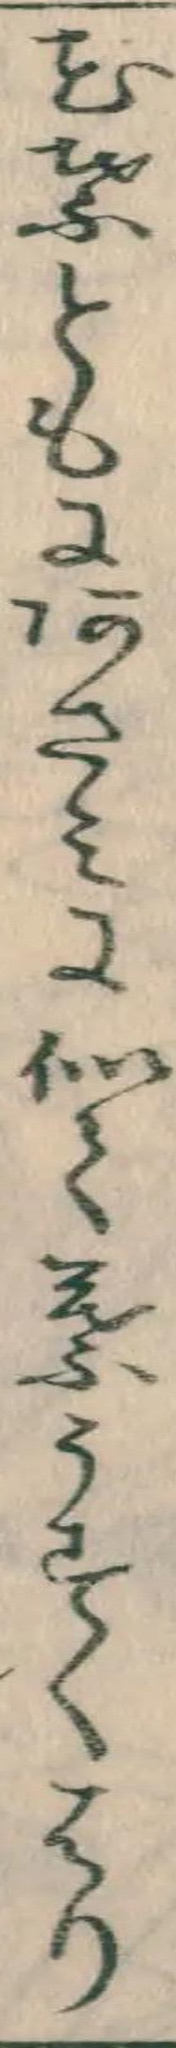花葉ともにあさみに似て葉うすくはり
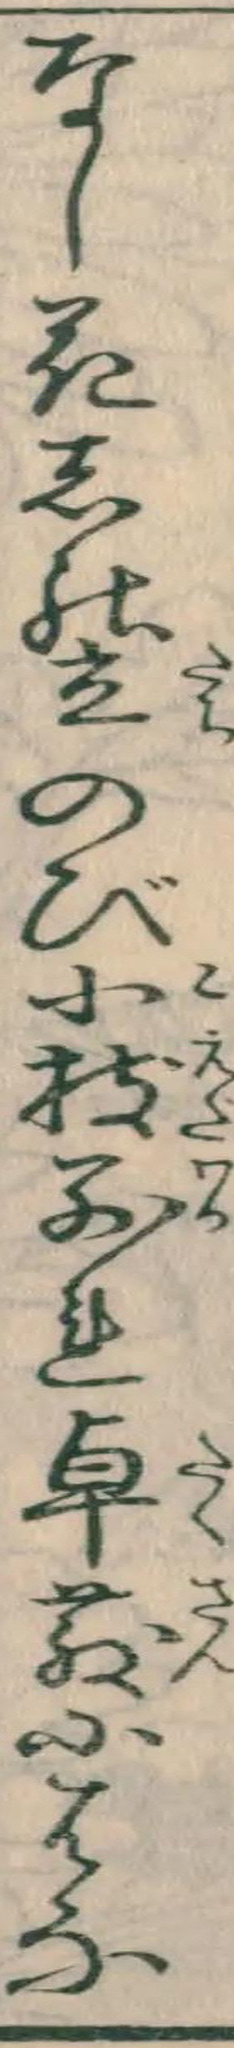なし花しの立のび小枝分れ卓散にはな
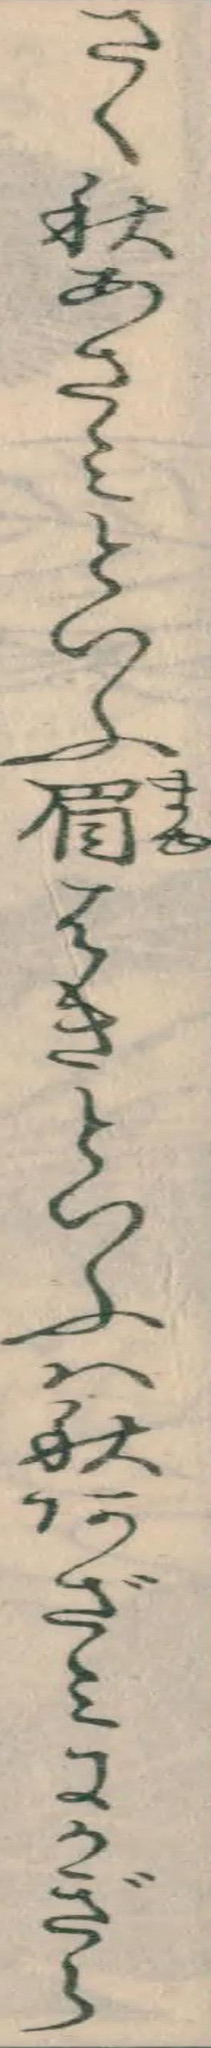さく秋あさみといふ眉はきといふは秋あざみにかぎら
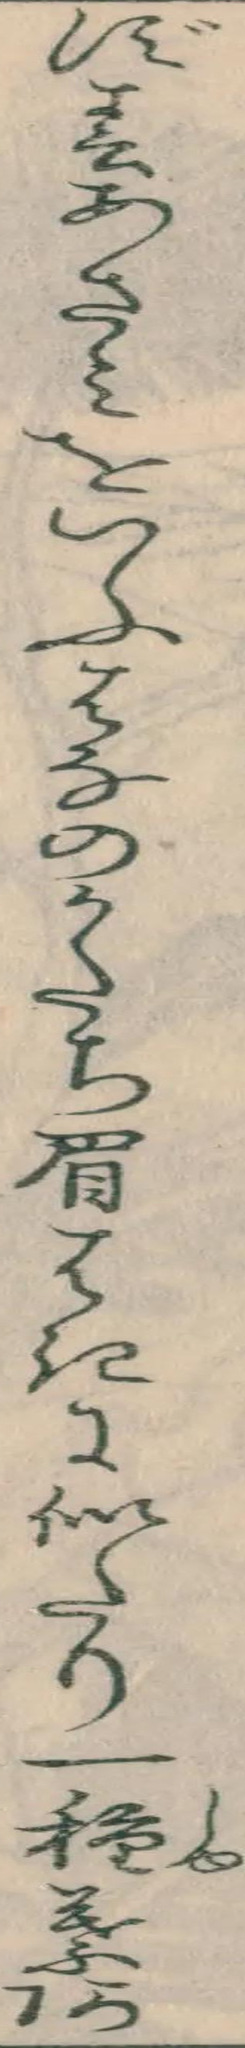ず春あさみをいふはなのかたち眉はきに似たり一種葉あ
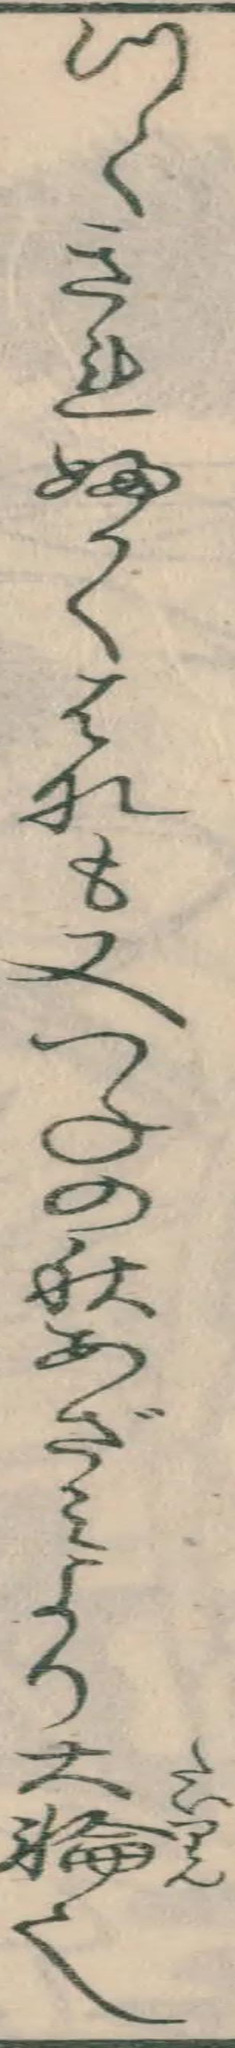つくきれふかくはなも又つねの秋あざみより大輪也
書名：畫本野山草. [1]
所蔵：国立国会図書館 National Diet Library, JAPAN
